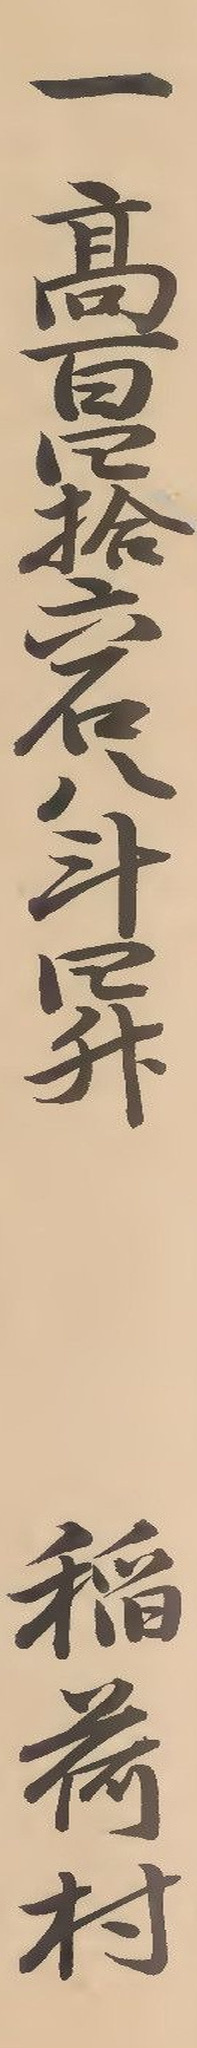一高百四拾六石八斗四升稲荷村
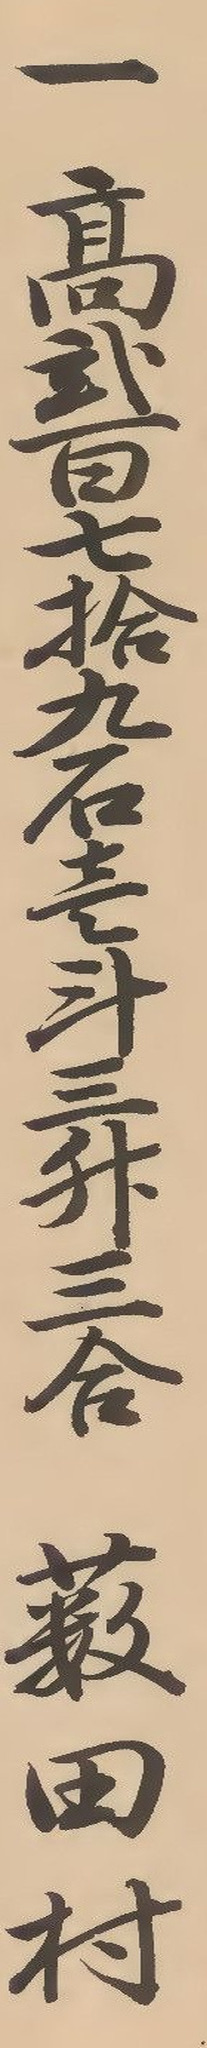一高弐百七拾九石壱斗三升三合薮田村
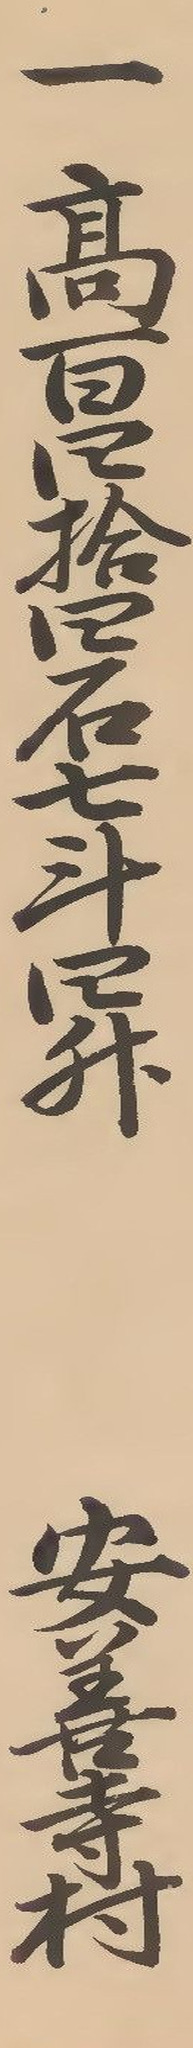一高百四拾四石七斗四升安善寺村
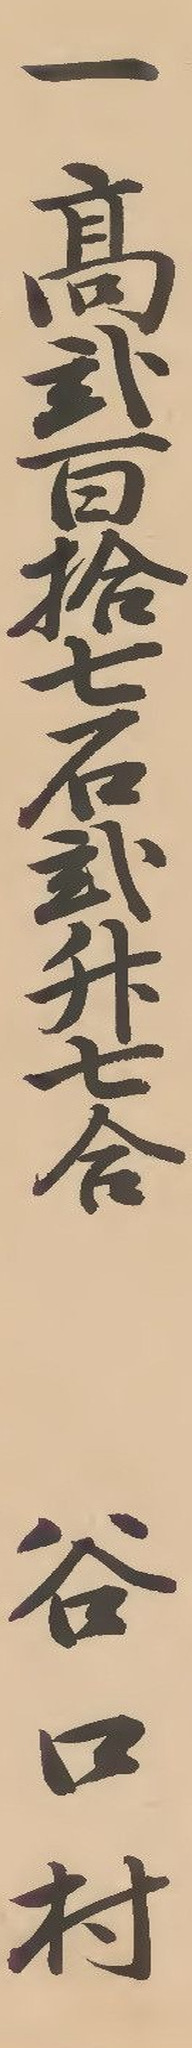一高弐百拾七石弐升七合谷口村

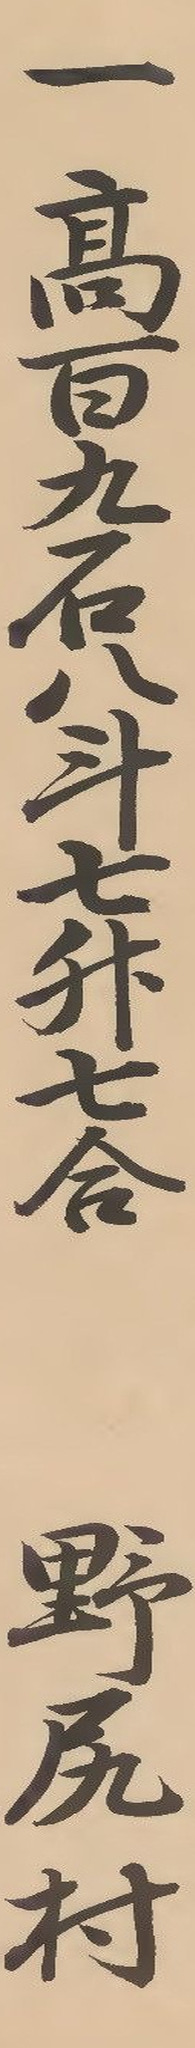一高百九石八斗七升七合野尻村
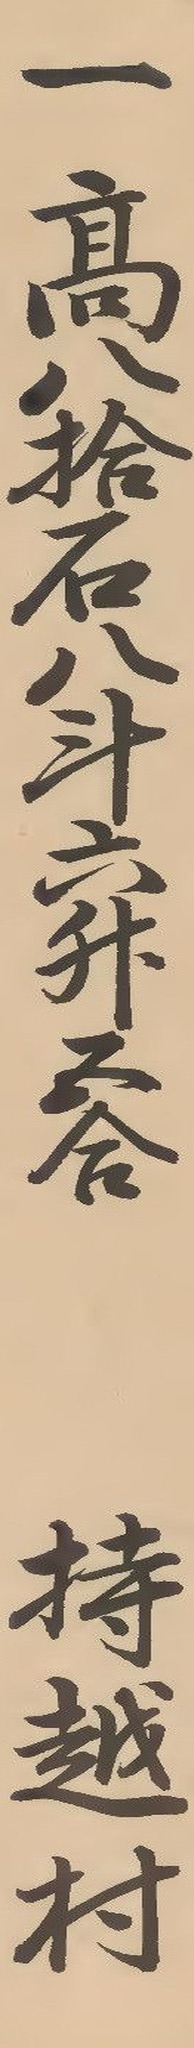一高八拾石八斗六升五合持越村
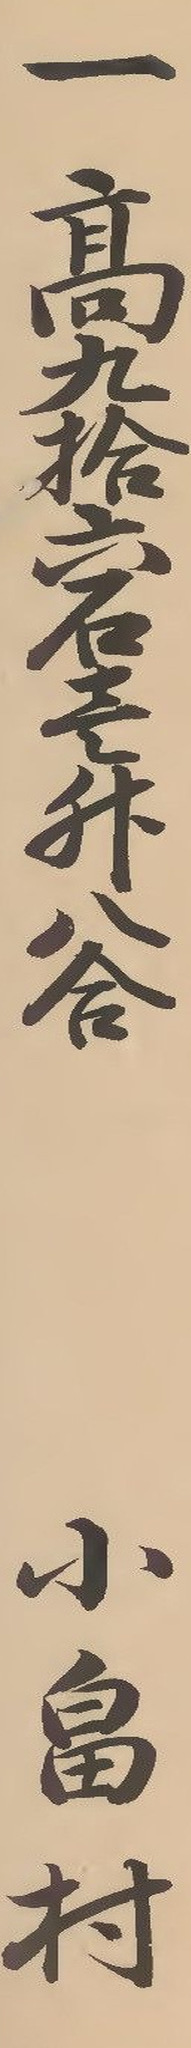一高九拾六石壱升八合小畠村
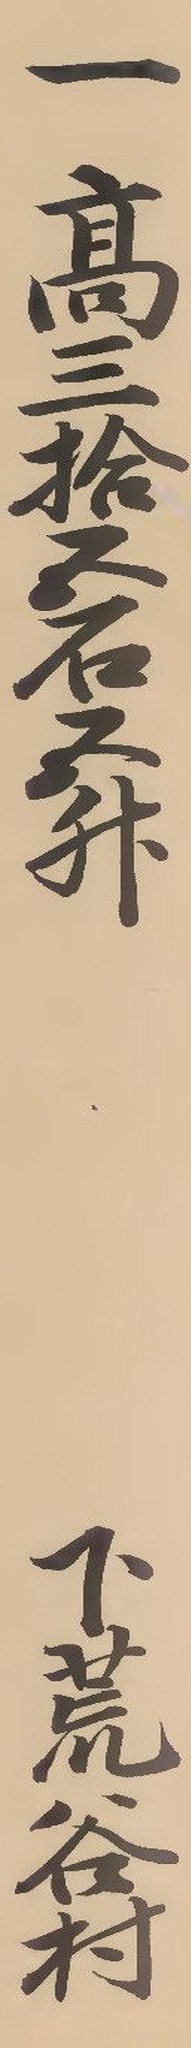一高三拾五石五升下荒谷村
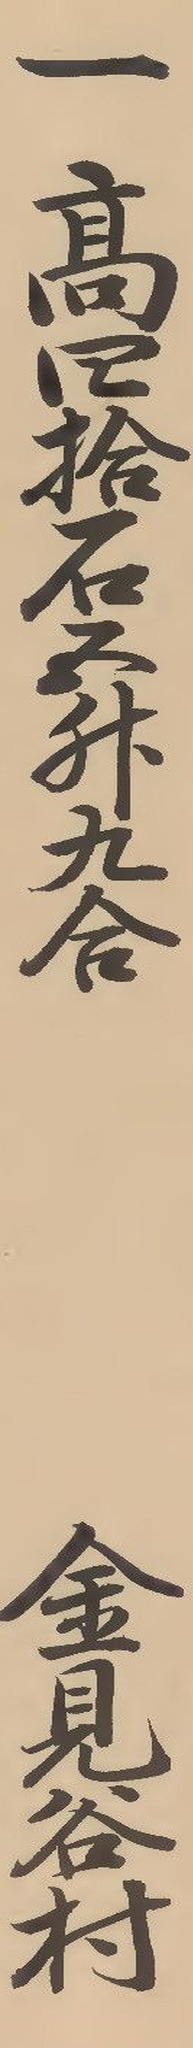一高四拾石五升九合金見谷村
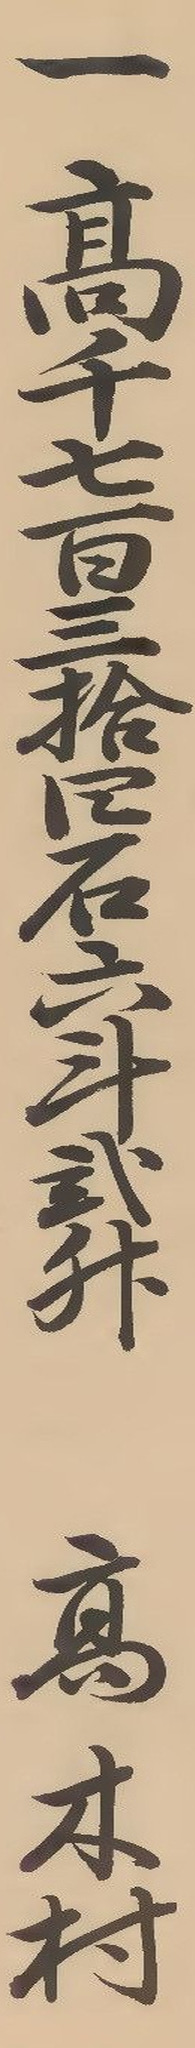一高千七百三拾四石六斗弐升高木村
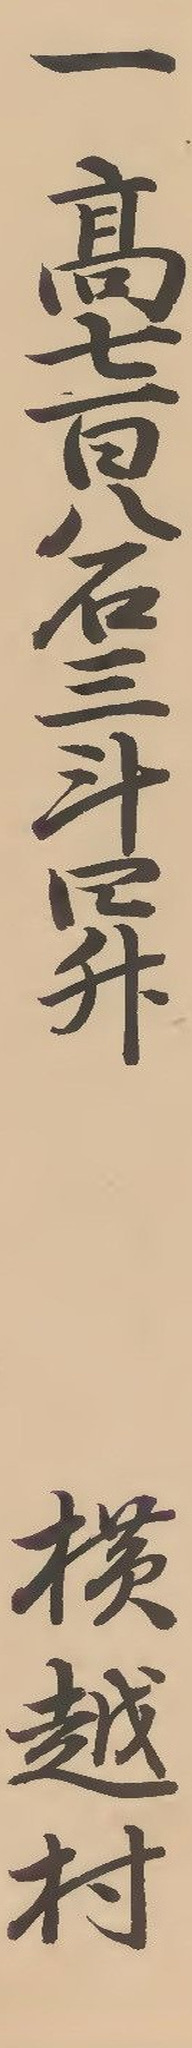一高七百八石三斗四升横越村

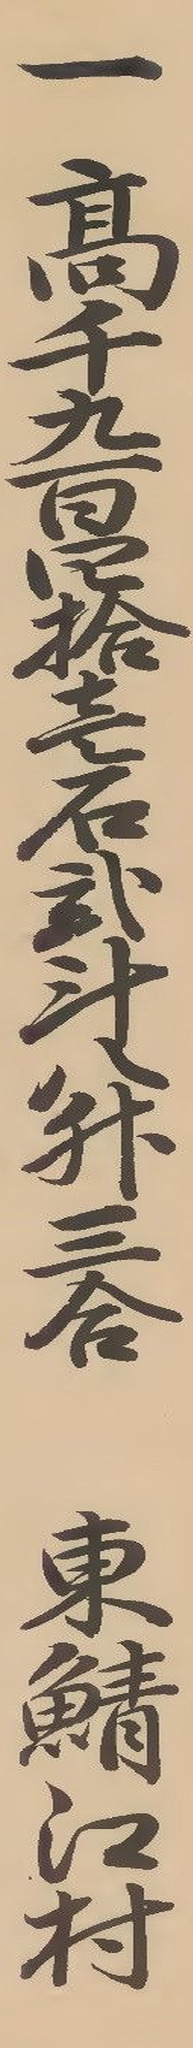一高千九百四拾壱石弐斗八升三合東鯖江村
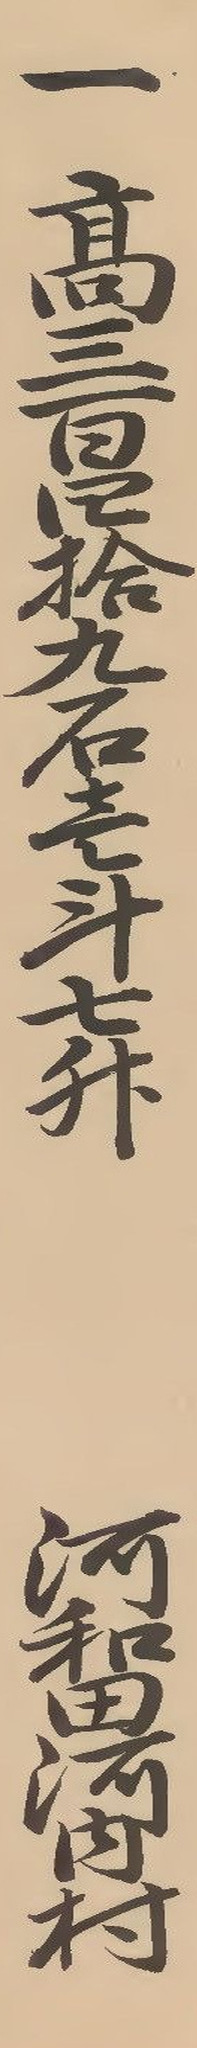一高三百四拾九石壱斗七升河和田河内村
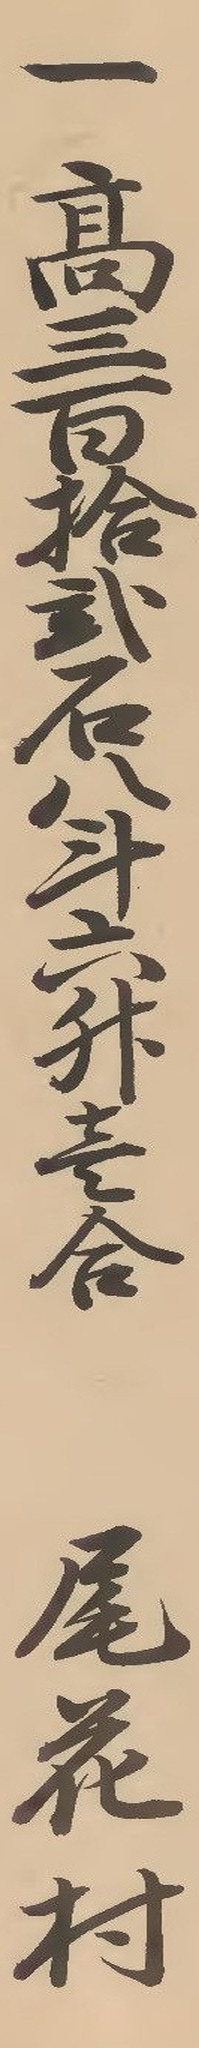一高三百拾弐石八斗六升壱合尾花村
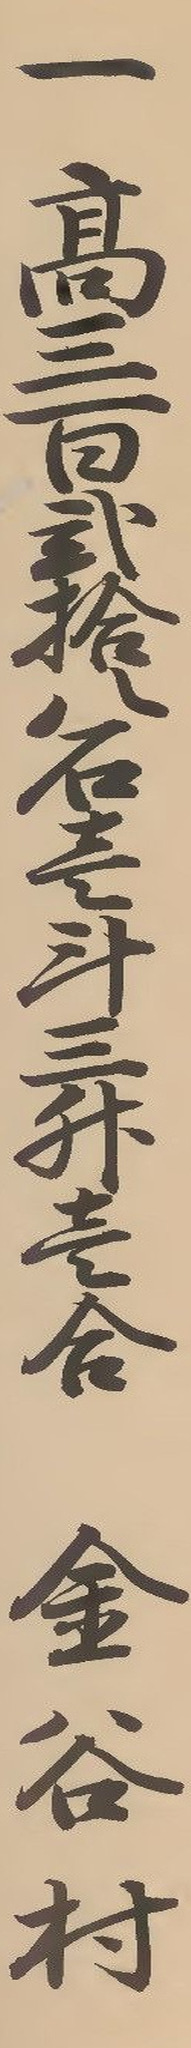一高三百弐拾八石壱斗三升壱合金谷村
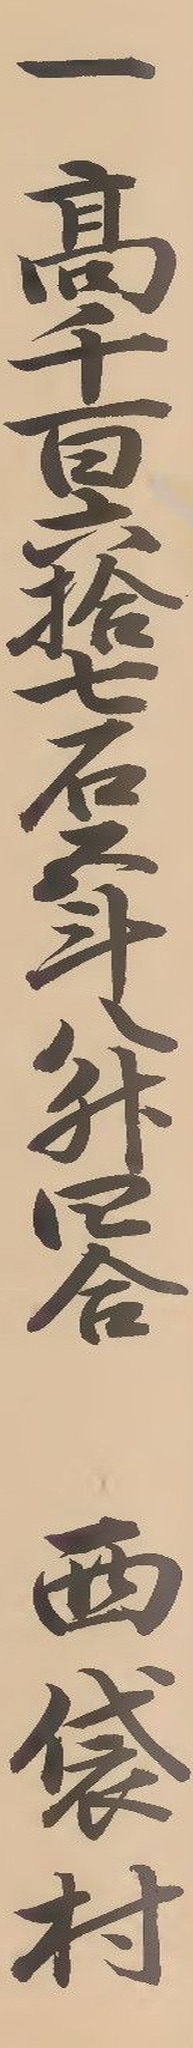一高千百六拾七石五斗八升四合西袋村
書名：越前国郷帳
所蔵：国立公文書館 National Archives of Japan
